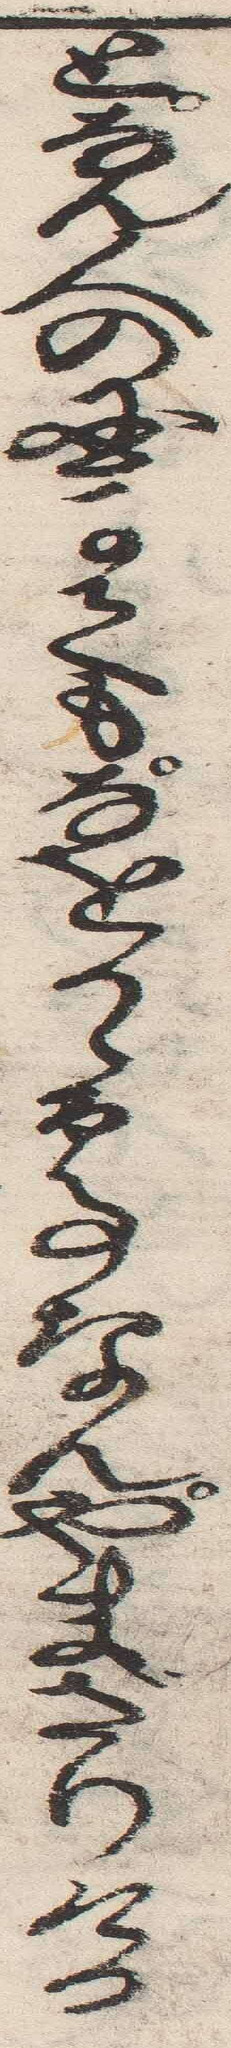と。なん人の国にても。なをかゝる事なん。やまざりける
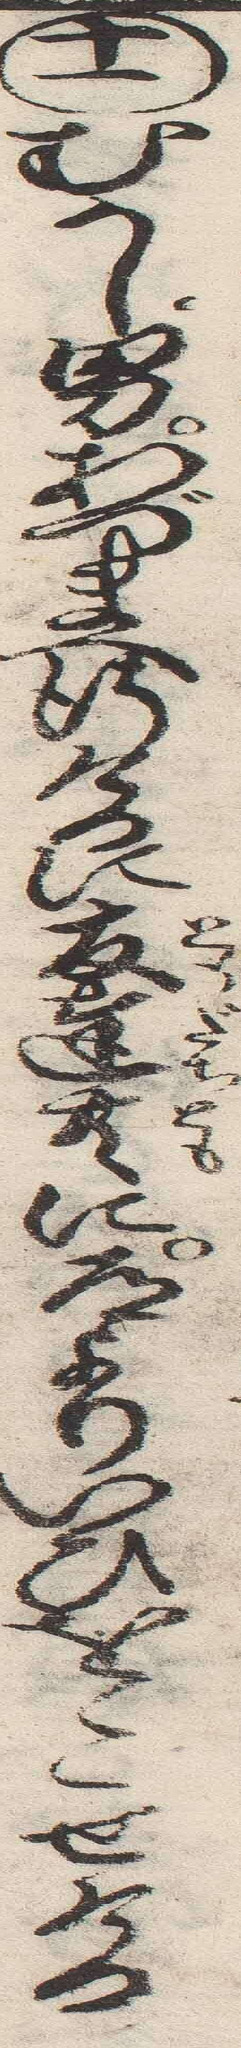十一むかし。男。あづまへ行けるに友達共に。道よりいひをこせける
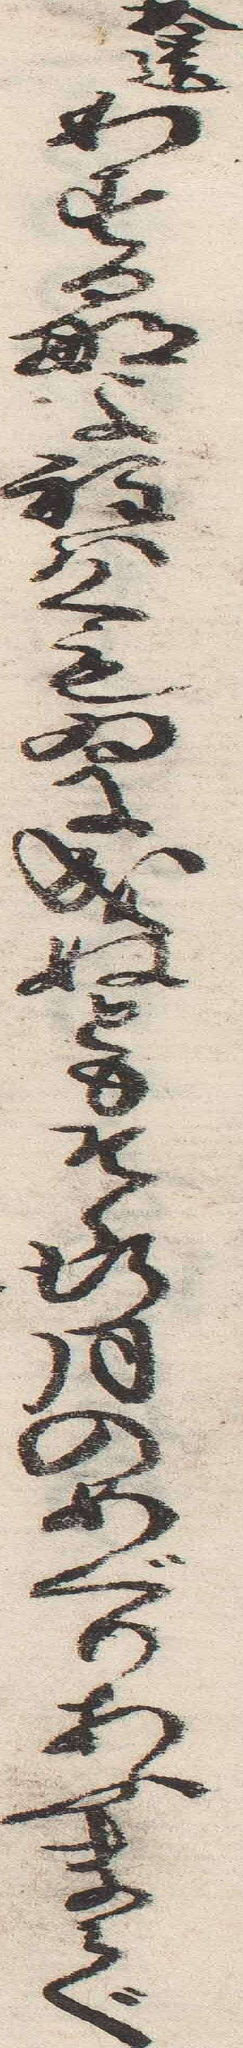拾遺わするなよ程はくもゐに成ぬともそら行月のめぐりあふまで
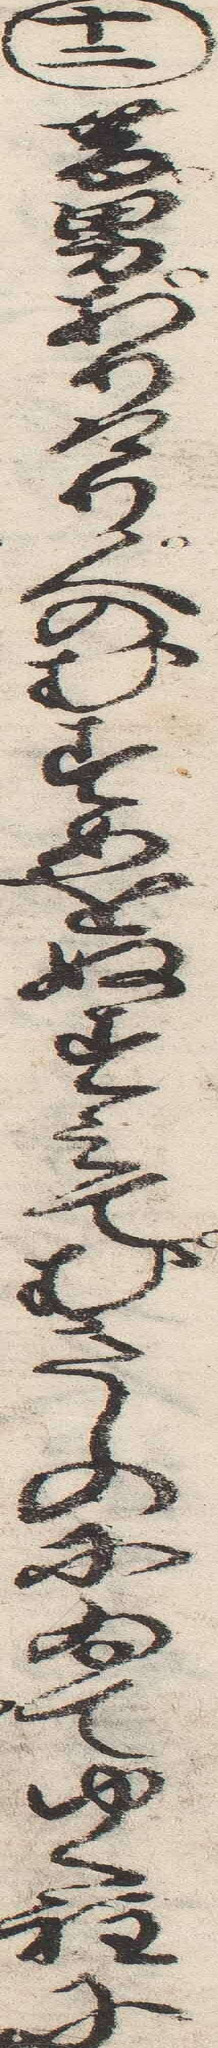十二昔。男。ありけり。人のむすめをぬすみて。むさしのにゐてゆく程に
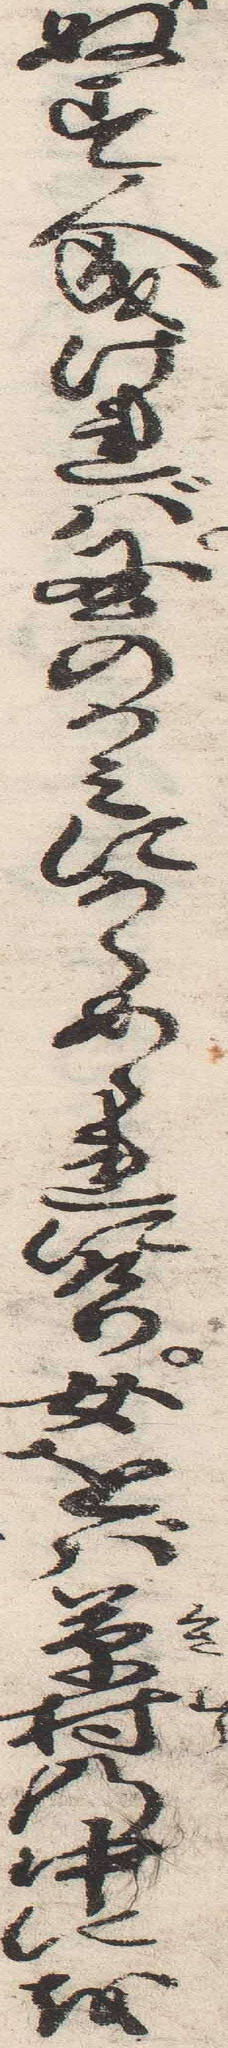ぬす人成ければ。国のかみにからめられにけり。女をば草村の中にを
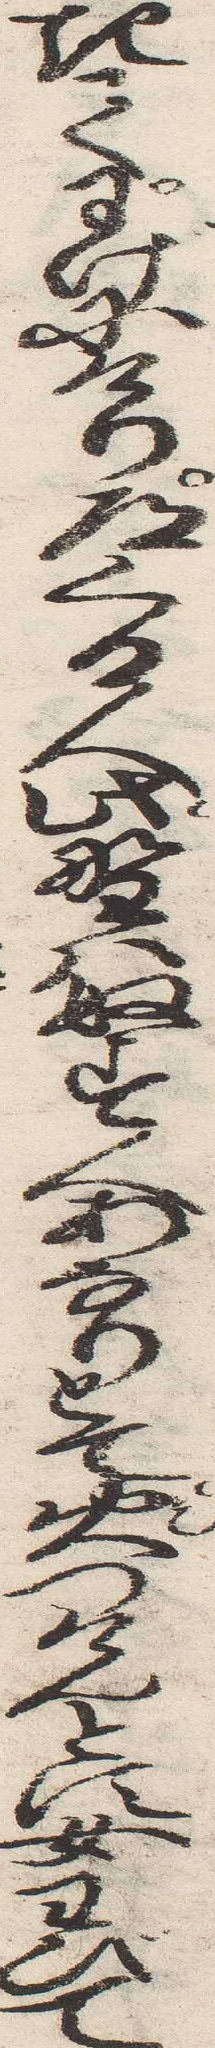きて。にげにけり。道くる人。此野はぬす人あなりとて。火つけんとす女わびて
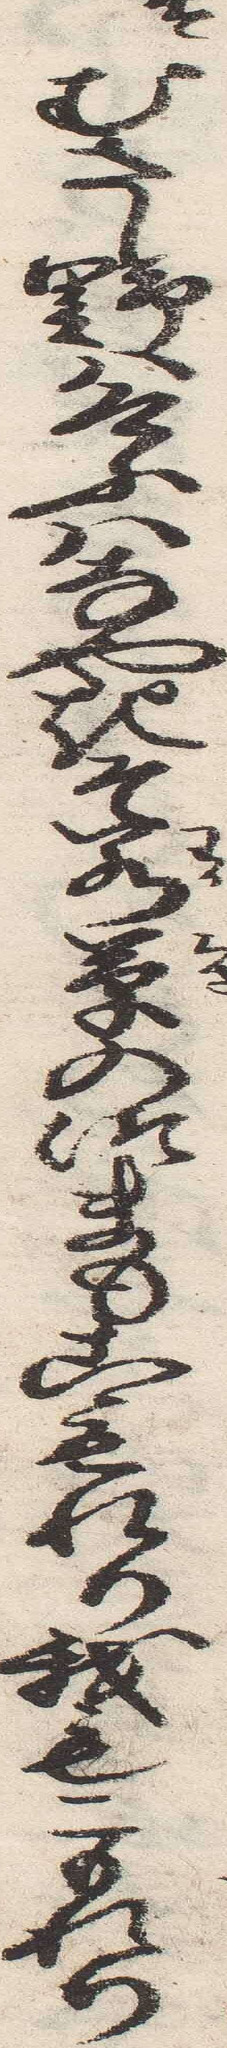古今むさし野はけふはなやきそ若草のつまもこもれり我もこもれり
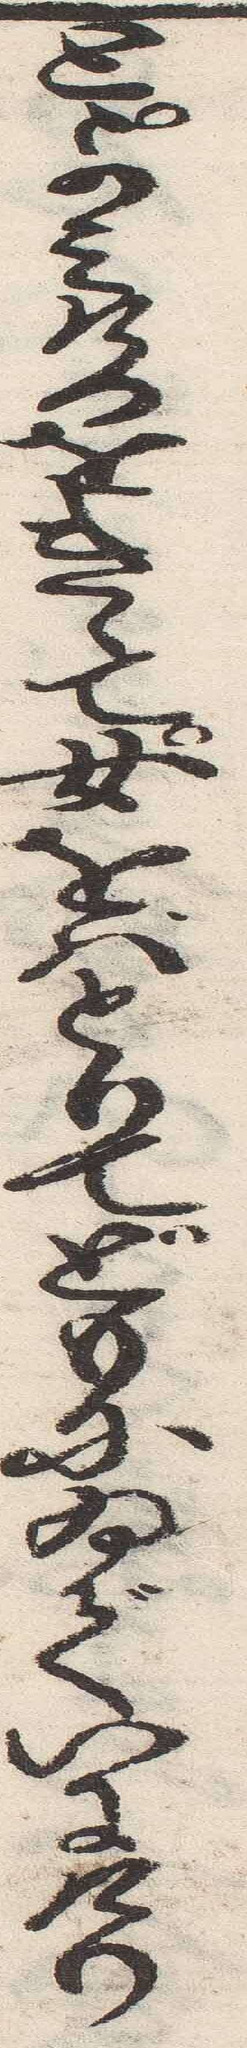と。よみけるをきゝて。女をばとりてどもにゐでいにけり
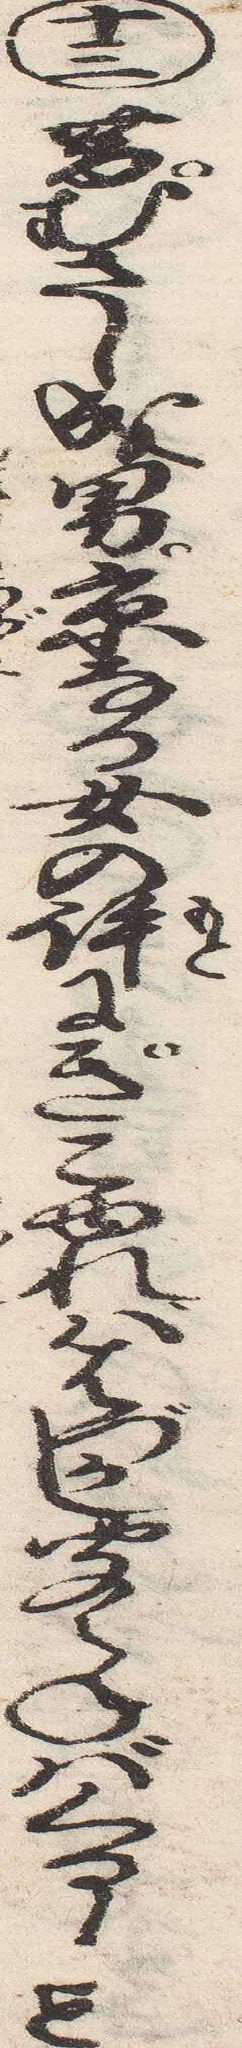十三昔。むさし成男。京なる女の許に。きこゆればはづかし。聞えねばくるしと
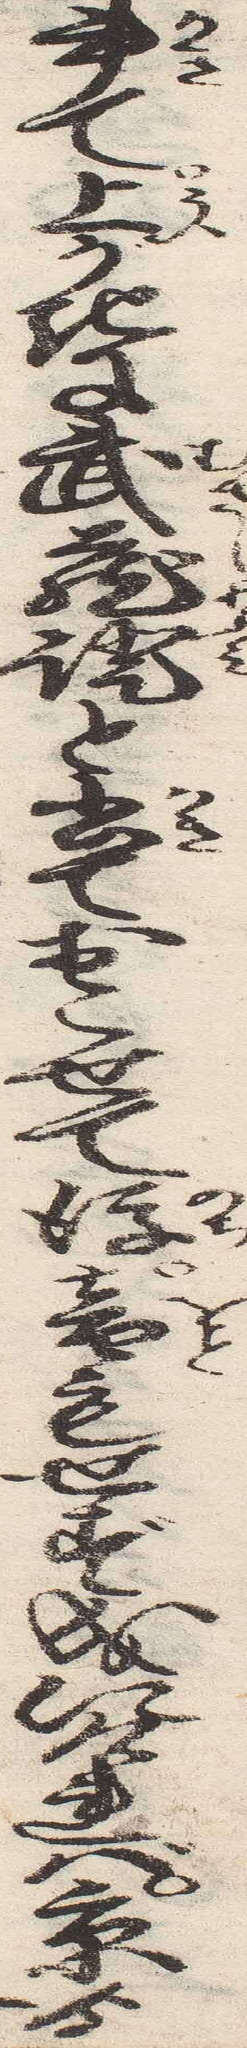書て。上かきに武蔵鐙と書ておこせて後。音もせず成にければ。京より女
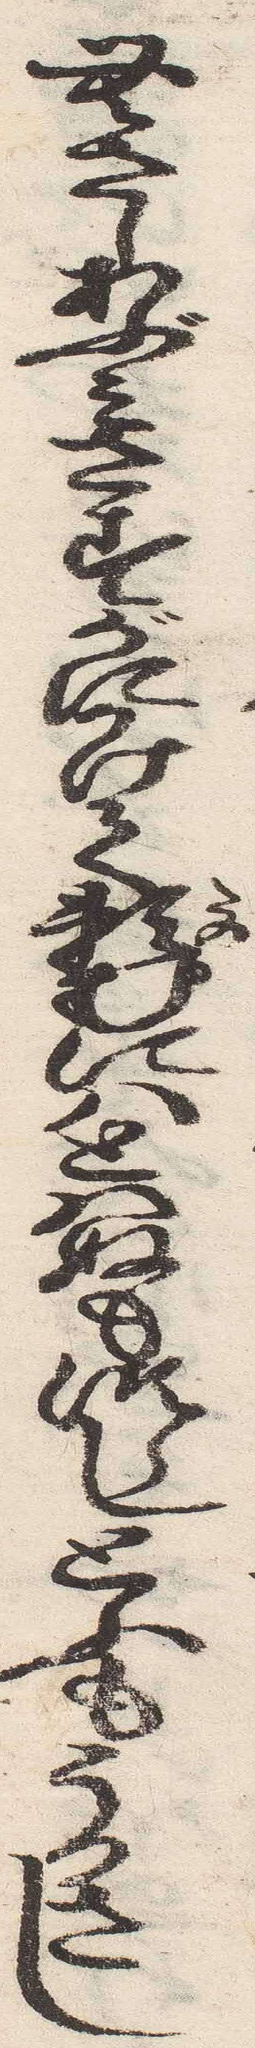むさしあぶみさすがにかけて頼むにはとはぬもつらしとふもうるさし

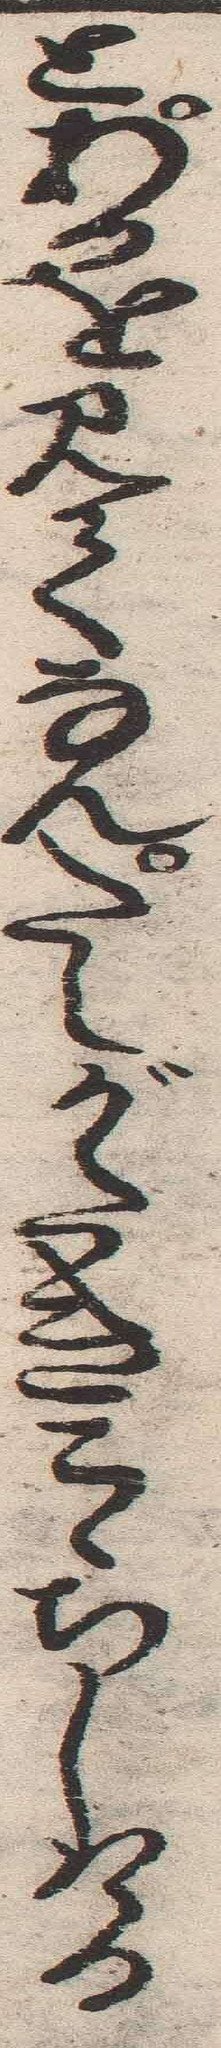と。あるを見てなん。たえがたきこゝちしける
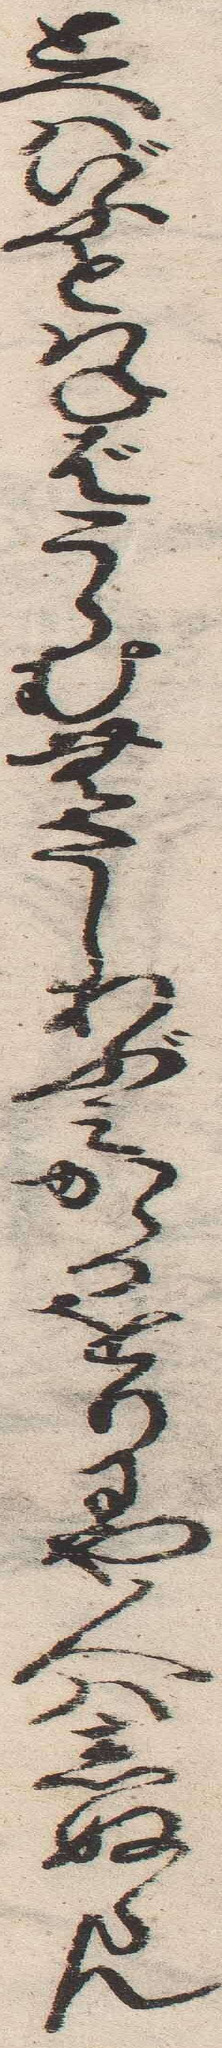とへばいふとはねばうらむむさしあぶみかゝるをりにや人はしぬらん
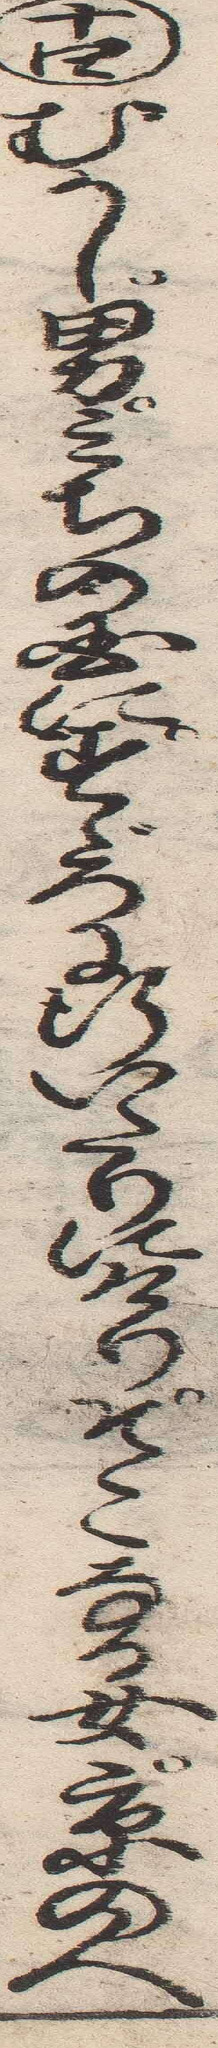十四むかし。男。みちの国に。すゞろに行いたりにけり。そこなる女。京の人
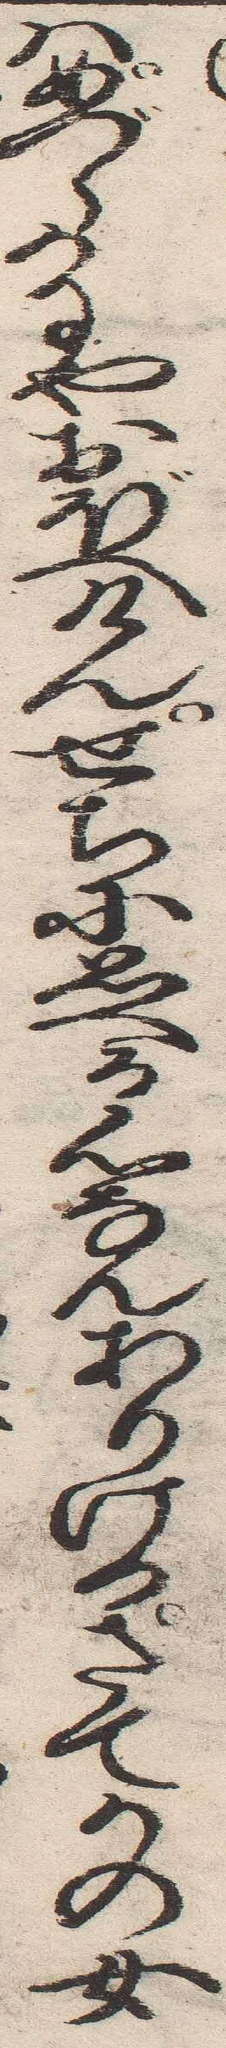は。めづらかにやおぼへけん。せちに思へる心なんありける。さてかの女
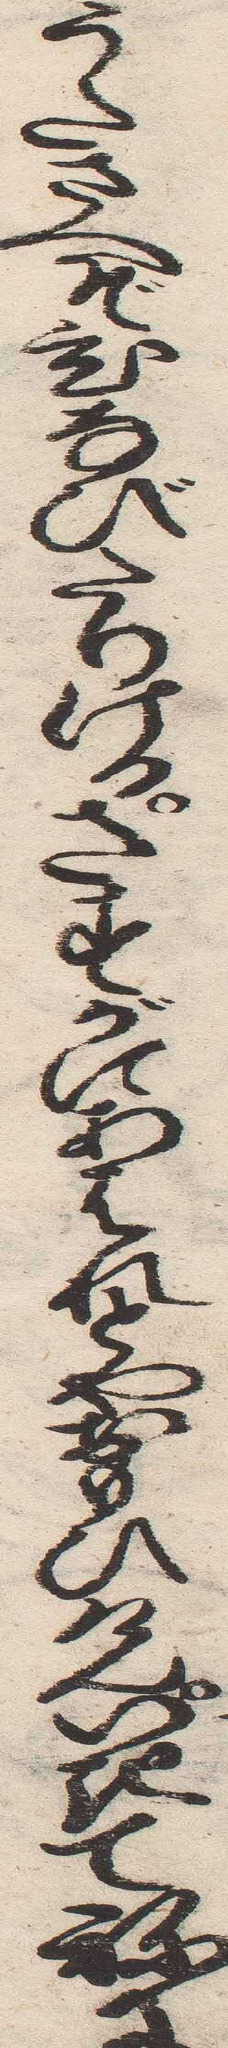うたさへぞひなびたりける。さすがにあはれとやおもひけん。いきてねに
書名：伊勢物語
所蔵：東京学芸大学附属図書館 国文学研究資料館
